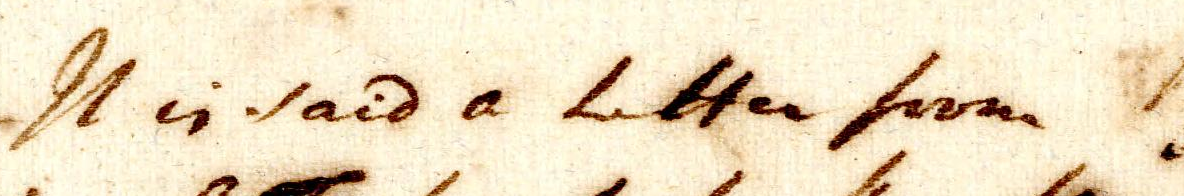It is said a Letter from
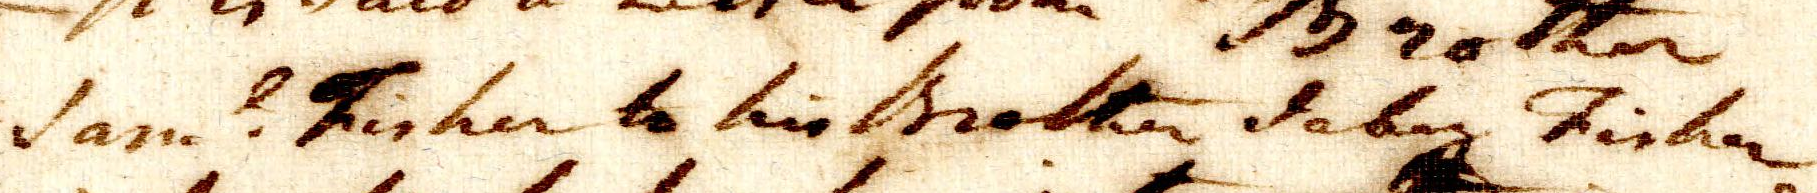Jam^s. Fisher to his Brother, Jabey Fisher
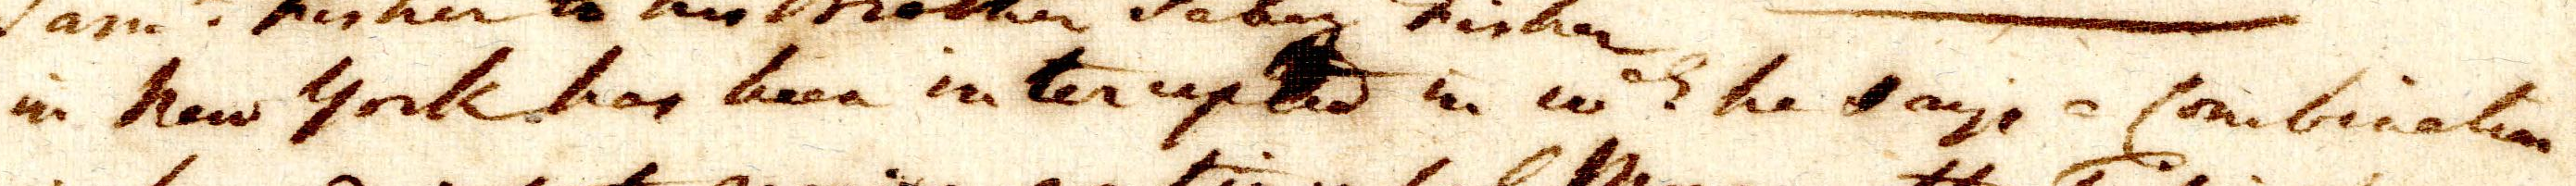in New Yorl has been interupted in w^ch he says a Combination
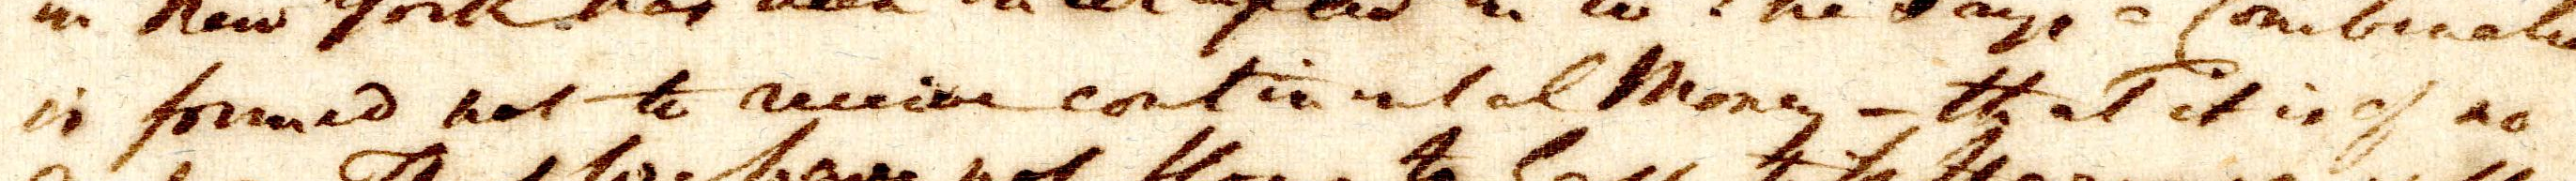is formed not to received continual Money. that it is of no
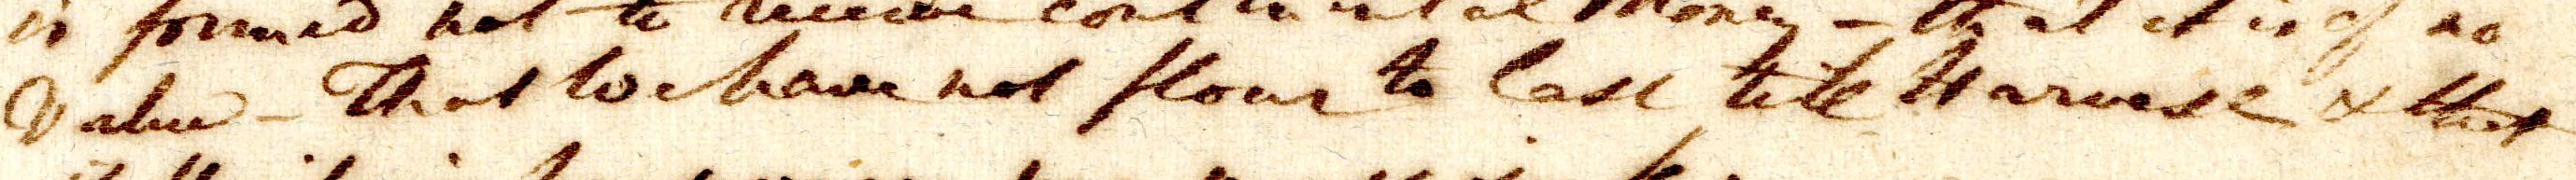Value. That we have not flour to casetite Harvese & that
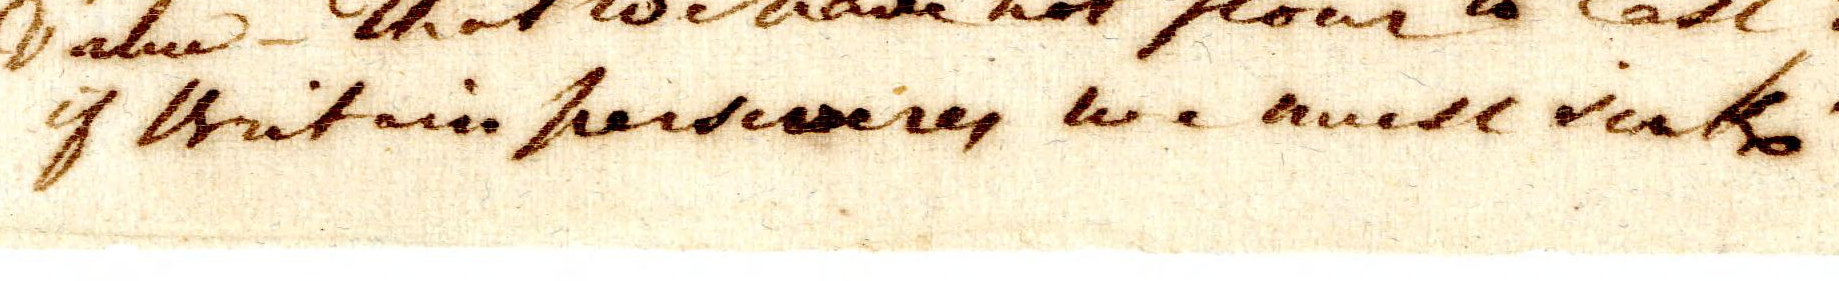if Britain perseveres we must see.
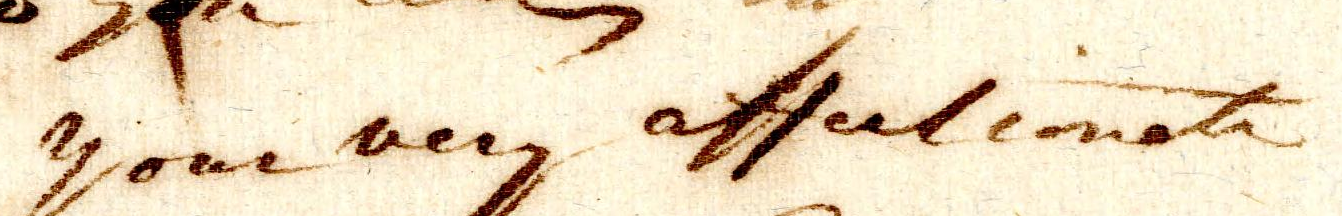your very affectionate
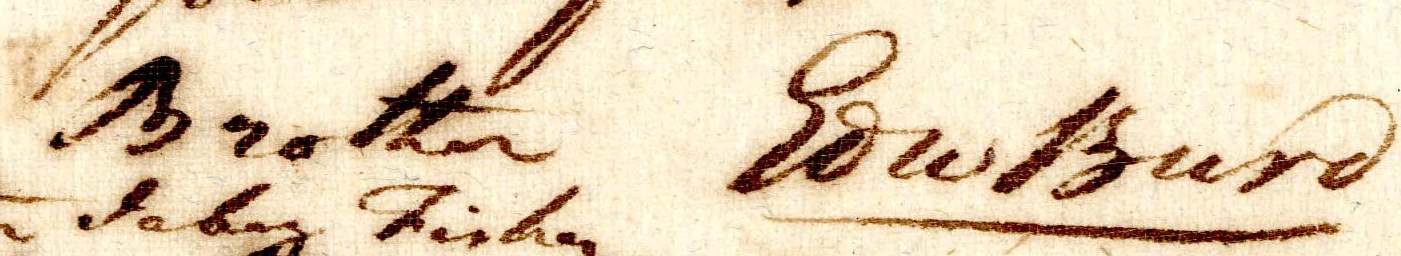Brother Edw. Burd
